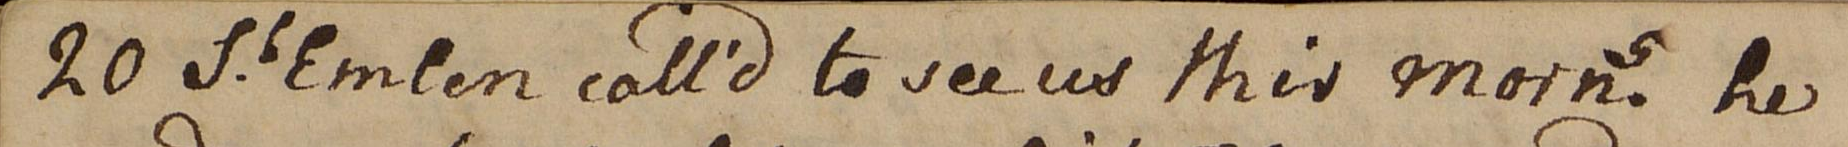20 S^l. Emlen call'd to see us this morn^g. he
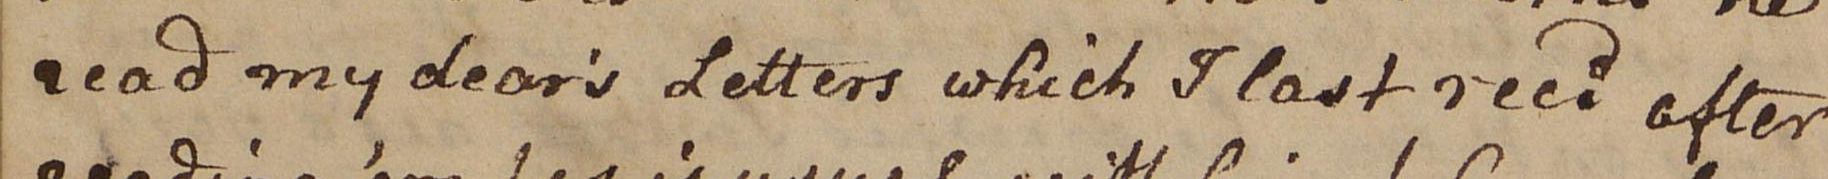read my dear's Letters which I last rec^d. after
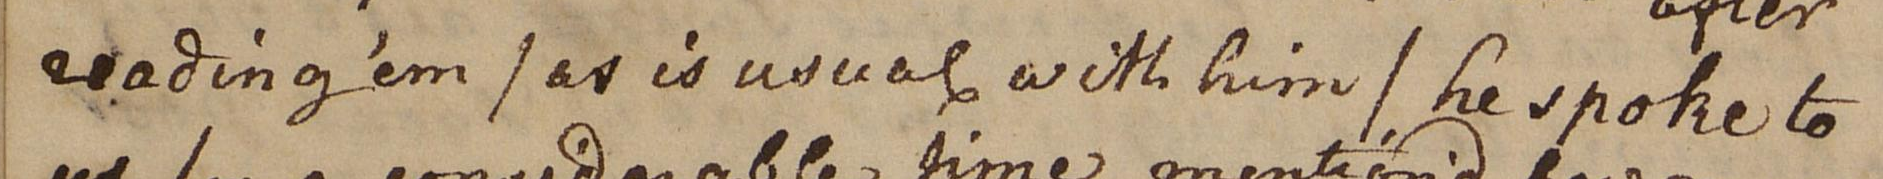reading 'em /as is usual with him/ he spoke to
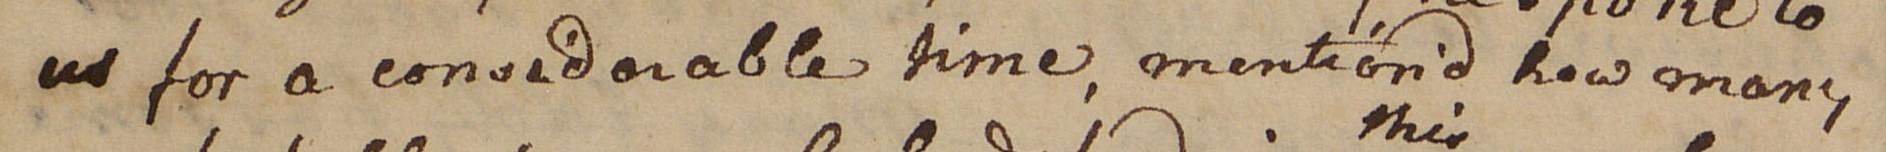us for a considerable time, mention'd how many
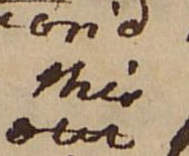this
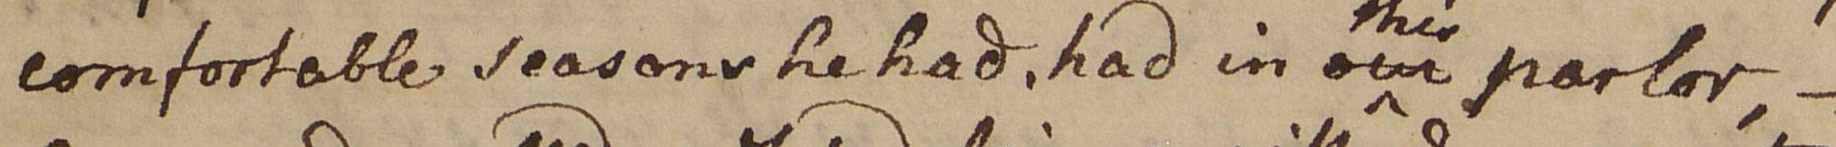comfortable seasons he had, had in [our] ^ parlor,-
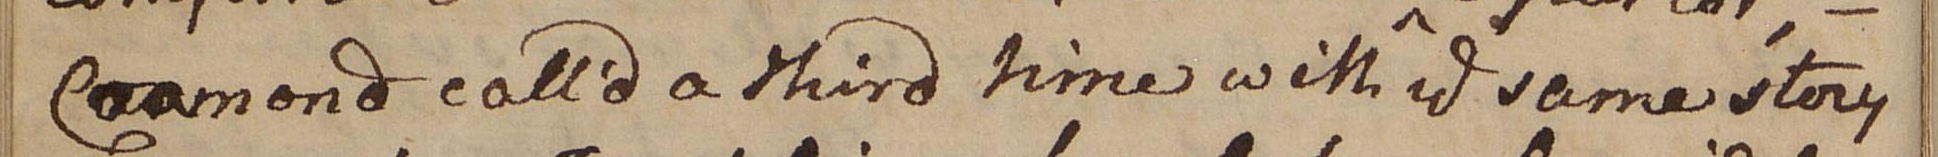Carmond call'd a third time with y^e same story
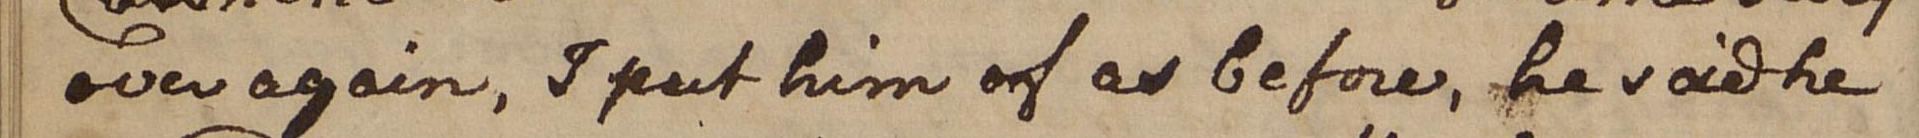evev again, I put him of as before, he said he
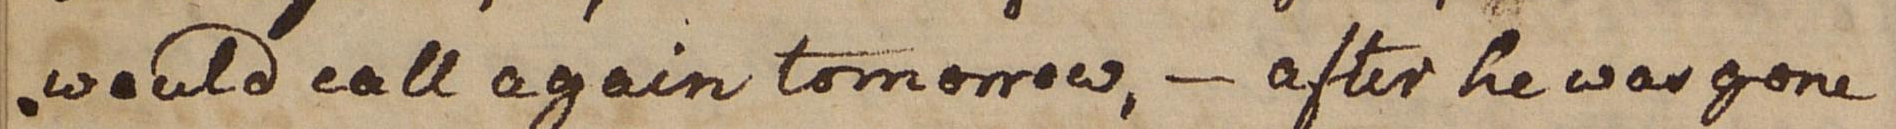would call again tomorrow,- after he was gone
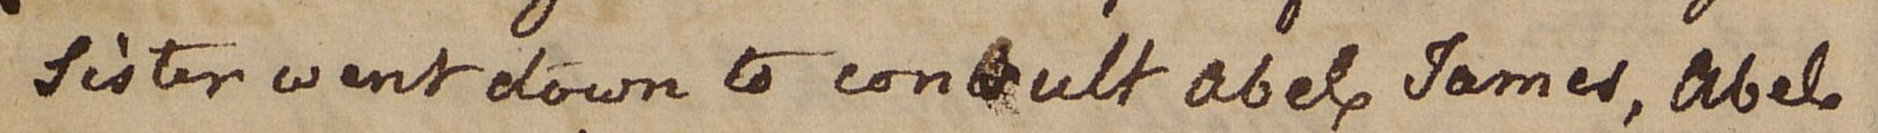Sister went down to consult Abel James, Abel
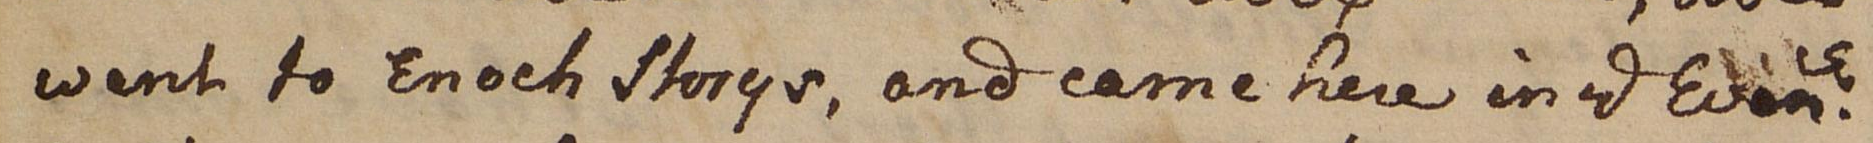went to Enoch Storys, and came here in y^e Even^g.
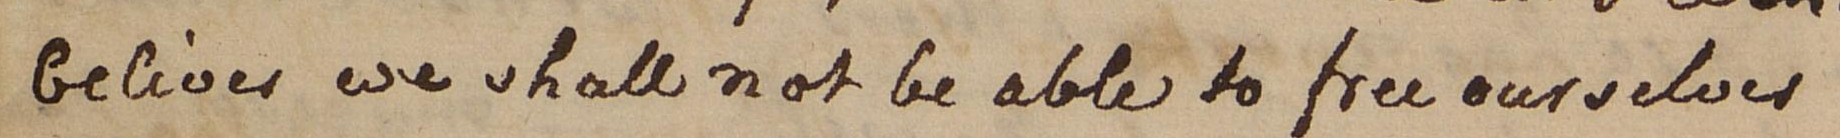belives we shall not be able to free ourselves
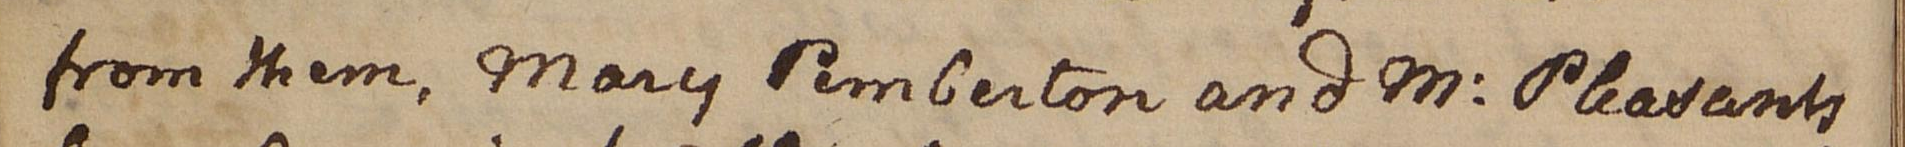from them, Mary Pemberton and M: Pleasants,
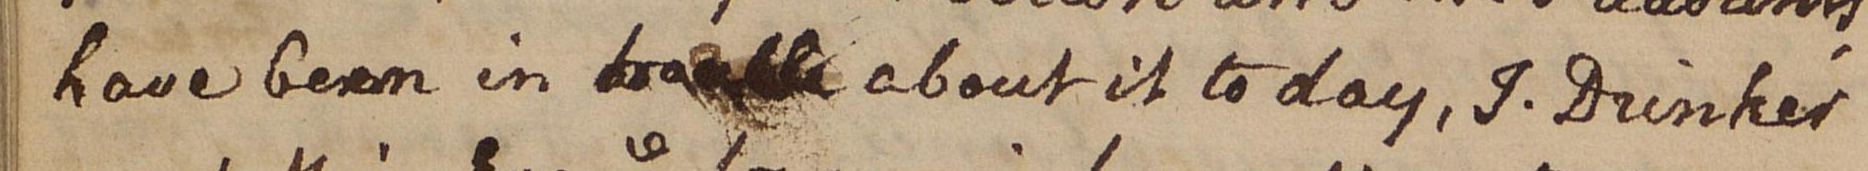have been in trouble about it to day, J. Drinker
